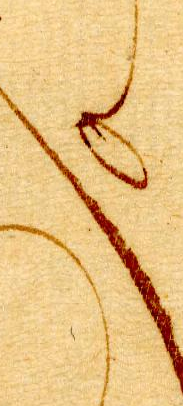To
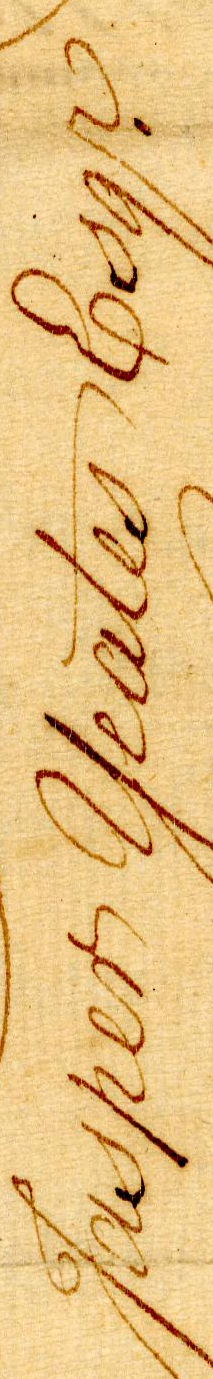Jasper Yeates Esq^r.
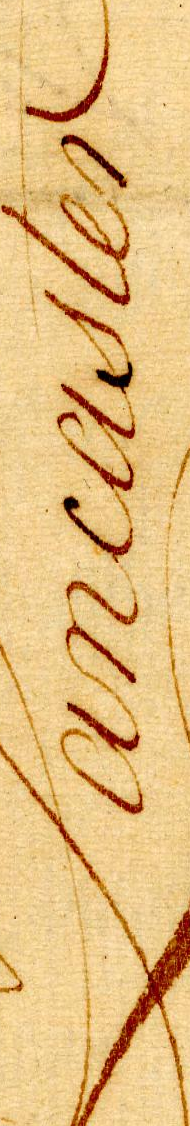Lancaster
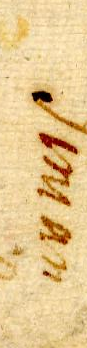Tinian
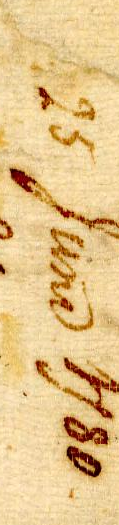25 June 1780
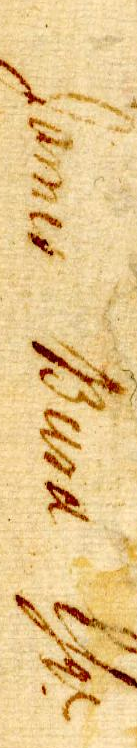James Burd Esq^r.
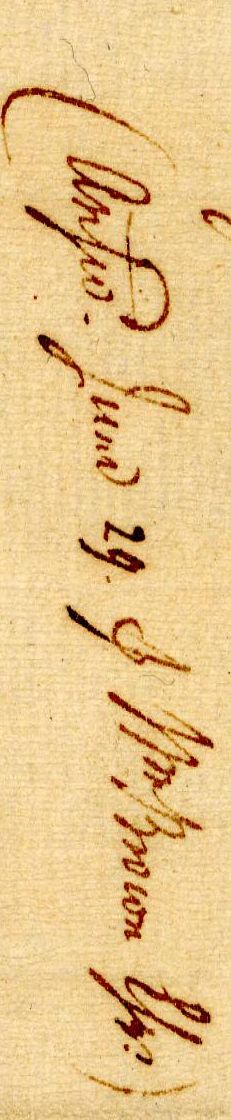(Answ^d. June 29. per W^m. Brown Esq^r.)
